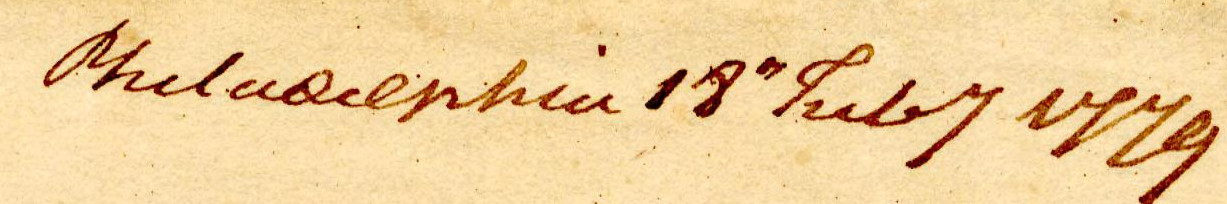Philadelphia 18^th Feb^y 1779
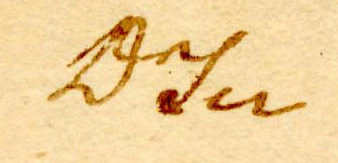D^r Sir
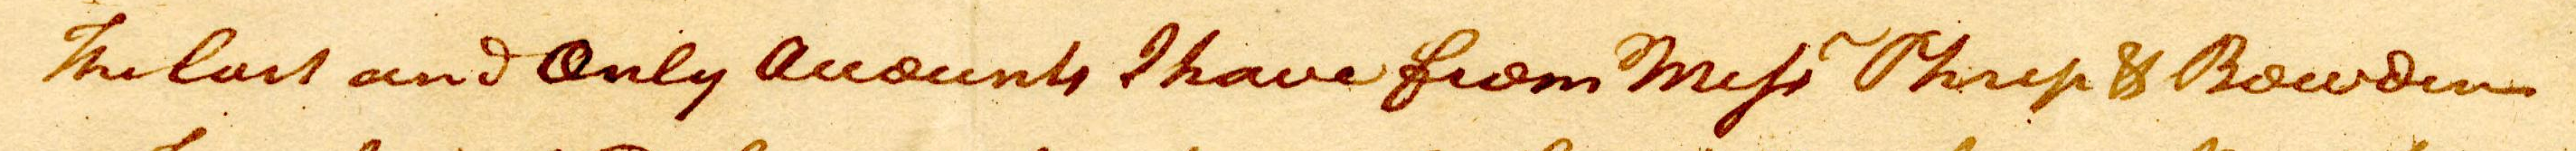The last and only Accounts I have from Mess^rs Philip & Bowder
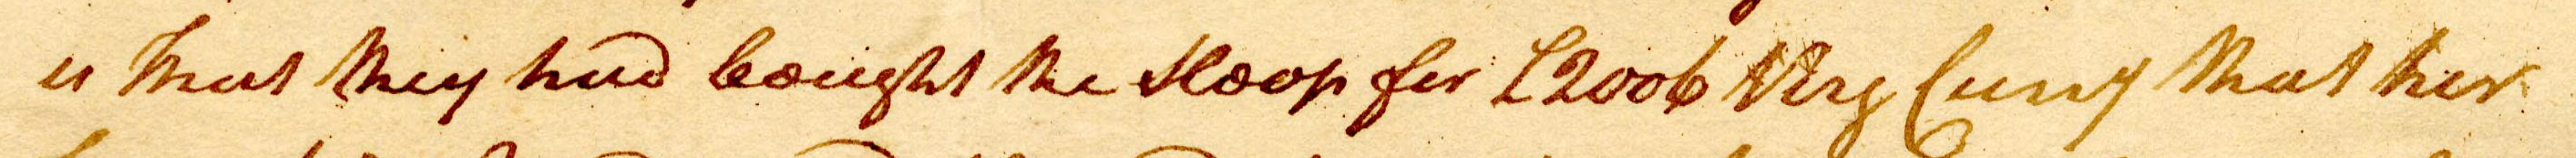is that they had bought the Sloop for £2006 Virg Curr^y that her
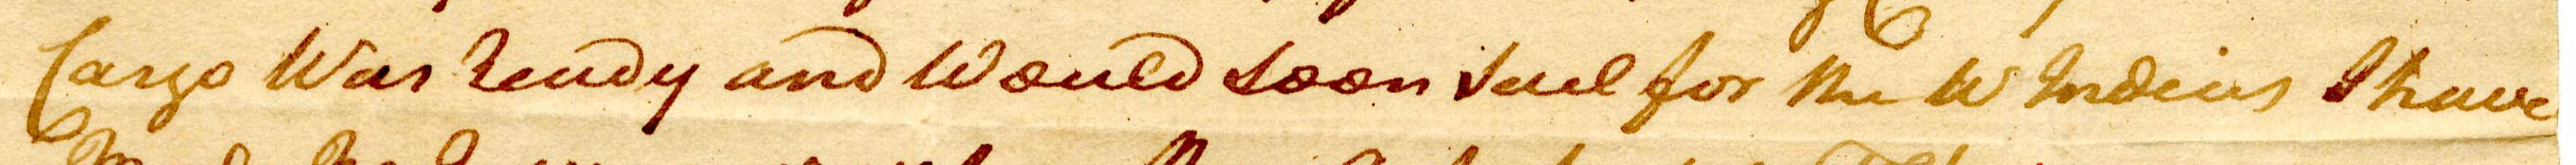cargo Was ready and Would soon sail for the W Indias I have
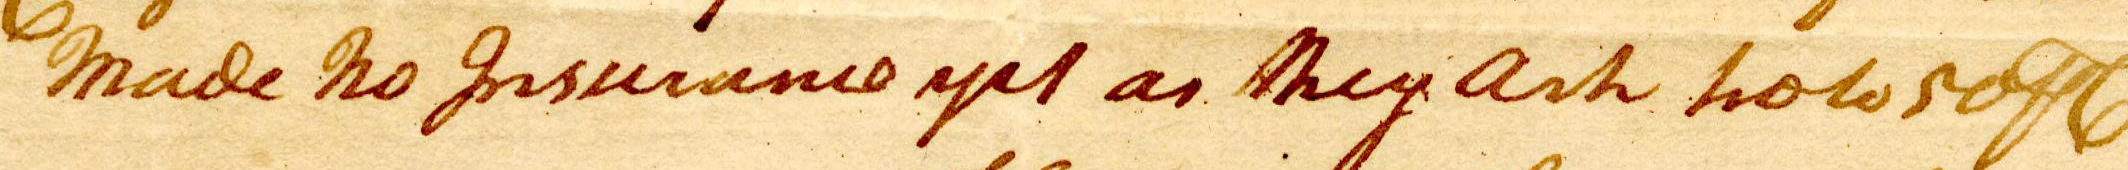made no Insurances yet as they ask how so per C
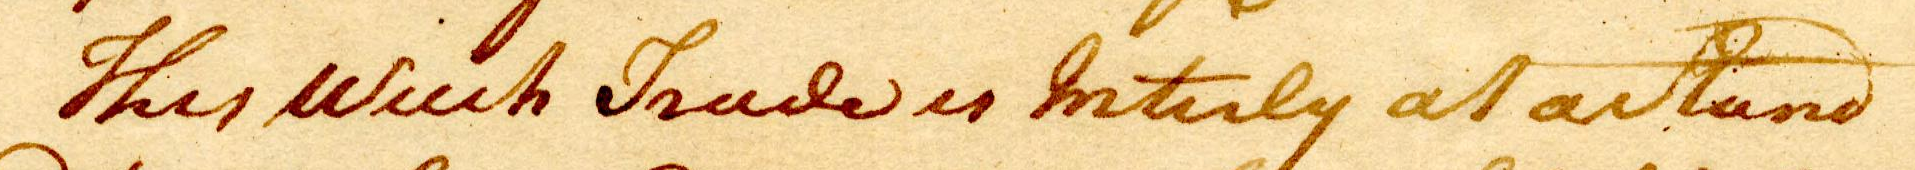This week Trade is Interly at a Stand
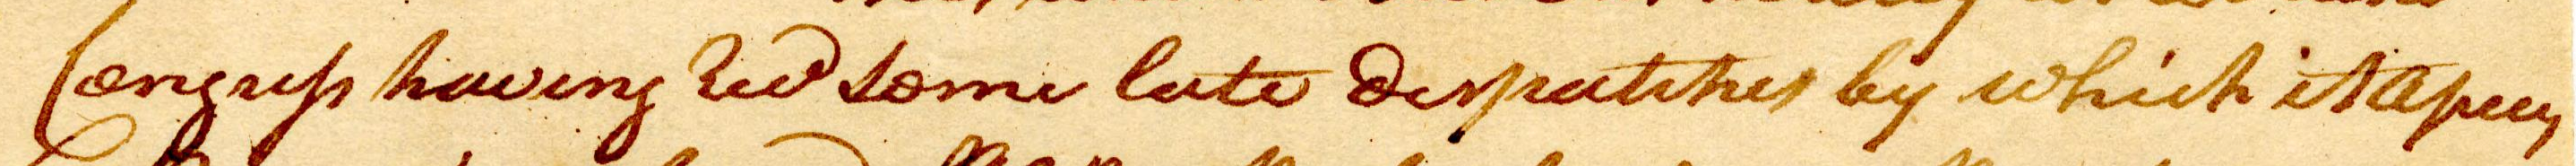Congress having rec^d some late departures by which is a peey
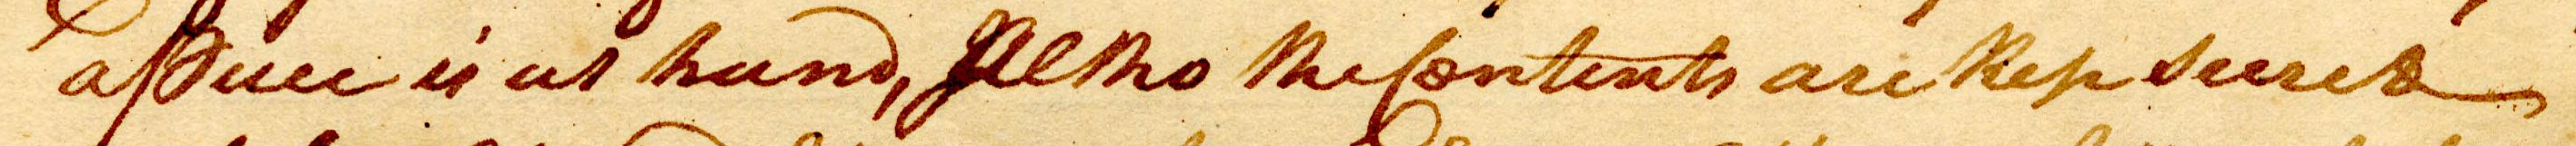a piece is at hand, Altho the Contents are kept secret
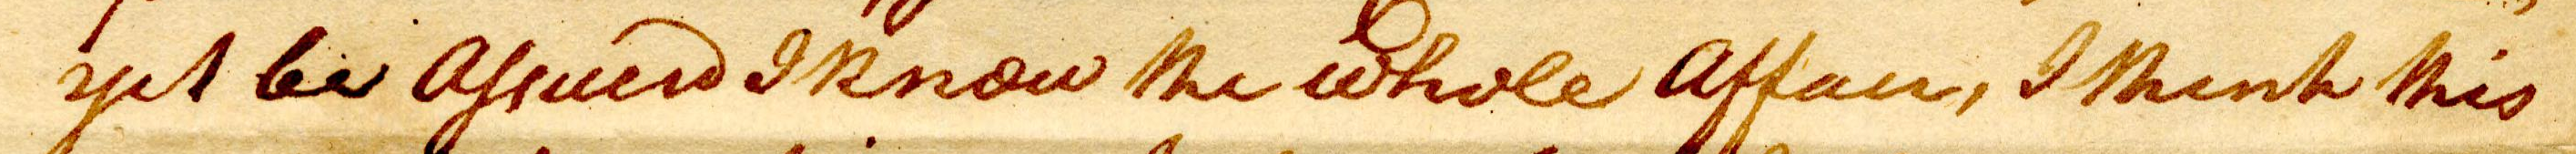yet be Assuerd I know the whole Affair, I think this
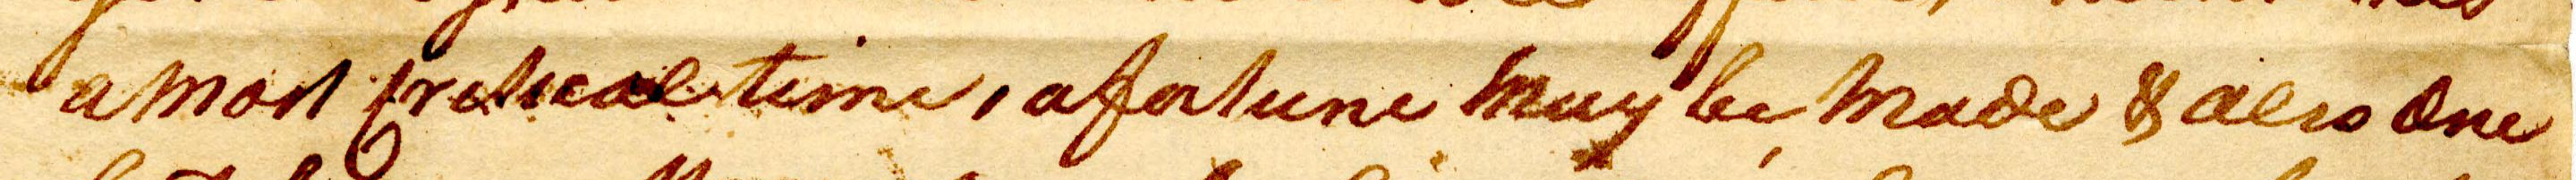a most Critical time, a fortune may be made & also one
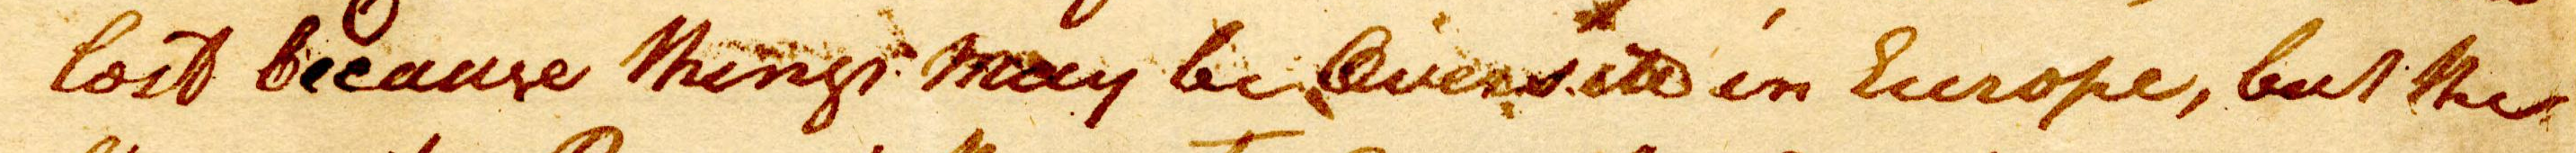lost because things may be Over sold in Europe, but the
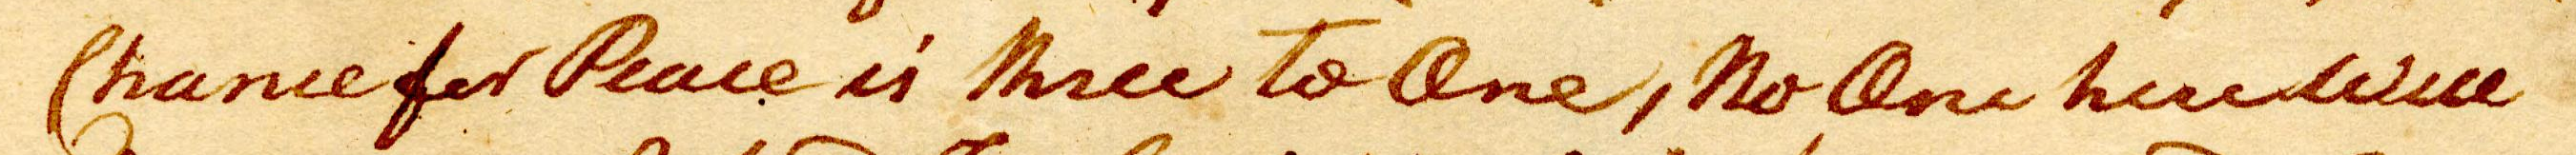chance for Peace is three to one, no One here will
